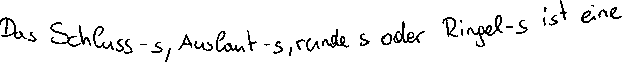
Das Schluss-s, Auslaut-s, runde s oder Ringel-s ist eine
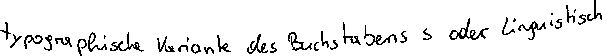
typographische Variante des Buchstabens s oder linguistisch
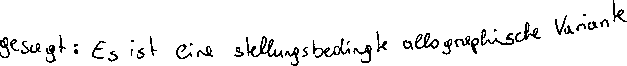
gesagt: Es ist eine stellungsbedingte allographische Variante
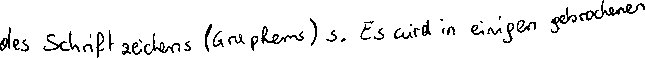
des Schriftzeichens (Graphems) s. Es wird in einigen gebrochenen
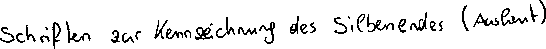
Schriften zur Kennzeichnung des Silbenendes (Auslaut)
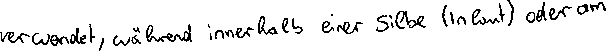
verwendet, während innerhalb einer Silbe (Inlaut) oder am
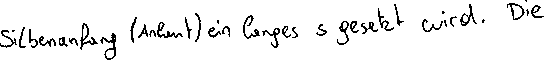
Silbenanfang (Anlaut) ein langes s gesetzt wird. Die
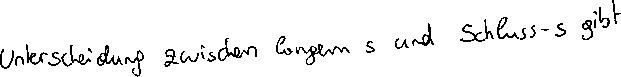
Unterscheidung zwischen langem s und Schluss-s gibt
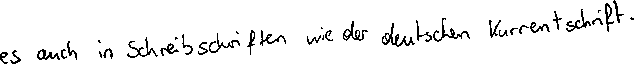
es auch in Schreibschriften wie der deutschen Kurrentschrift.
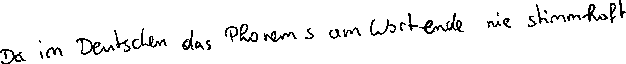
Da im Deutschen das Phonem s am Wortende nie stimmhaft
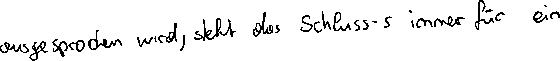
ausgesprochen wird, steht das Schluss-s immer für ein
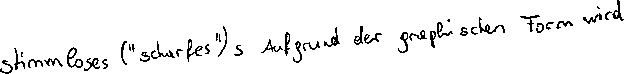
stimmloses ("scharfes") s Aufgrund der graphischen Form wird
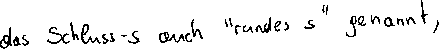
das Schluss-s auch "rundes s" genannt,
